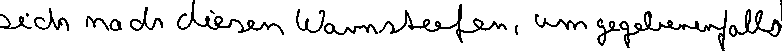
sich nach diesen Warnstufen, um gegebenenfalls
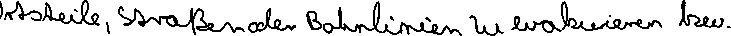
Ortsteile, Straßen oder Bahnlinien zu evakuieren bzw.
